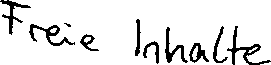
Freie Inhalte
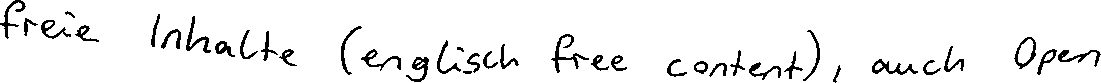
freie Inhalte (englisch free content), auch Open
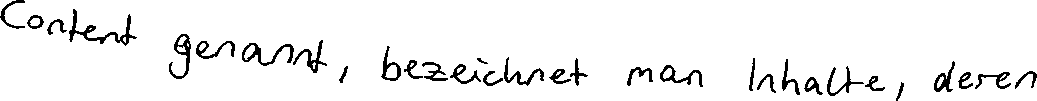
Content genannt, bezeichnet man Inhalte, deren
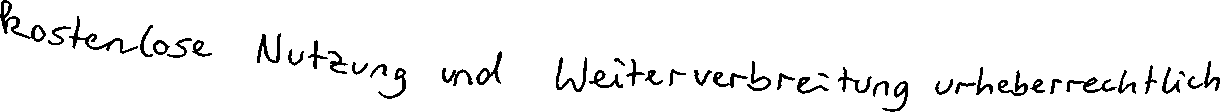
Kostenlose Nutzung und Weiterverbreitung urheberrechtlich
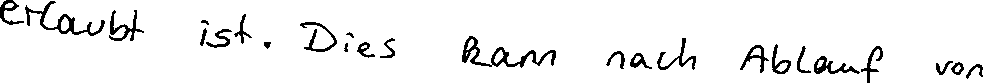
erlaubt ist. Dies kann nach Ablauf von
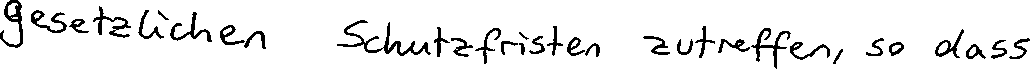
gesetzlichen Schutzfristen zutreffen, so dass
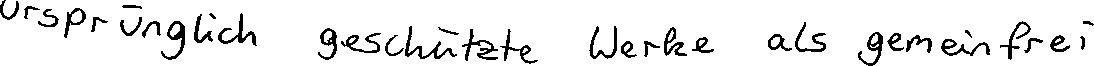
ursprünglich geschützte Werke als gemeinfrei
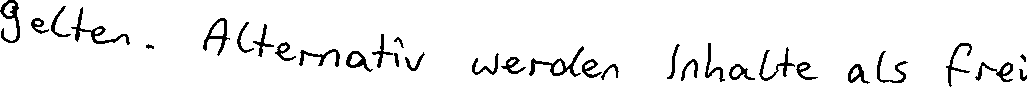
gelten. Alternativ werden Inhalte als frei
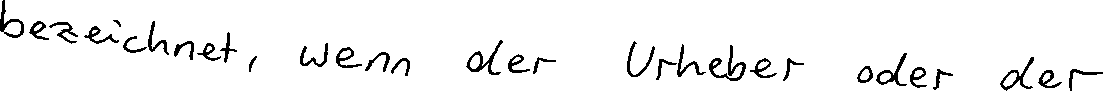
bezeichnet, wenn der Urheber oder der
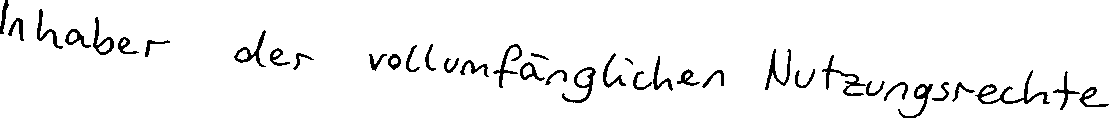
Inhaber der vollumfänglichen Nutzungsrechte
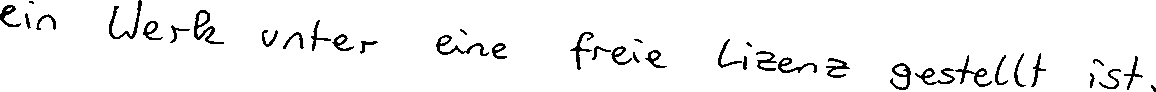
ein Werk unter eine freie Lizenz gestellt ist.
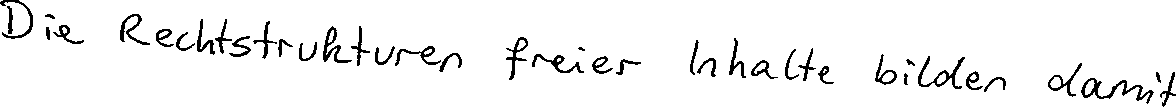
Die Rechtsstrukturen freier Inhalte bilden damit
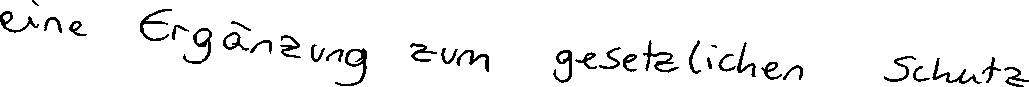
eine Ergänzung zum gesetzlichen Schutz
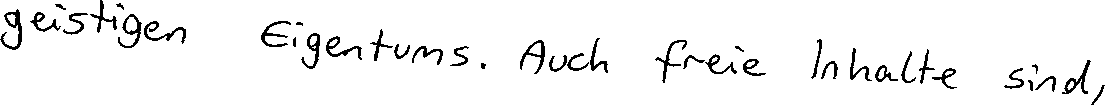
geistigen Eigentums. Auch freie Inhalte sind,
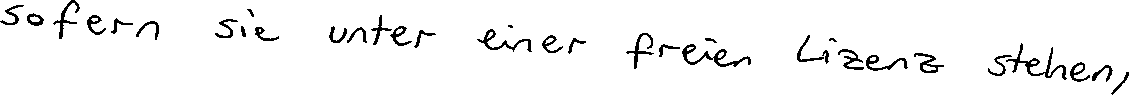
sofern sie unter einer freien Lizenz stehen,
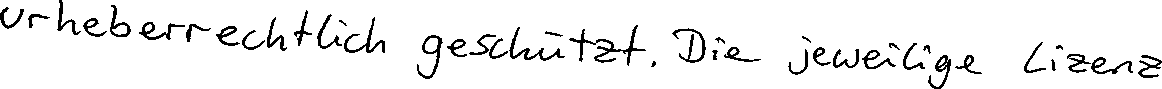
rheberrechtlich geschützt. Die jeweilige Lizenz
